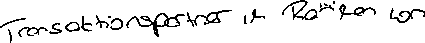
Transaktionspartner im Rahmen von
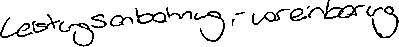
Leistungsanbahnung, -vereinbarung
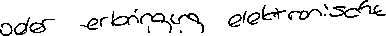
oder -erbringung elektronische
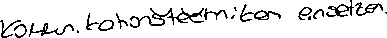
Kommunikationstechniken einsetzen.
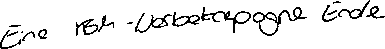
Eine IBM-Werbekampagne Ende
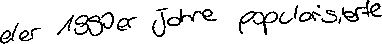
der 1990er Jahre popularisierte
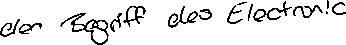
den Begriff des Electronic
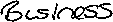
Business
